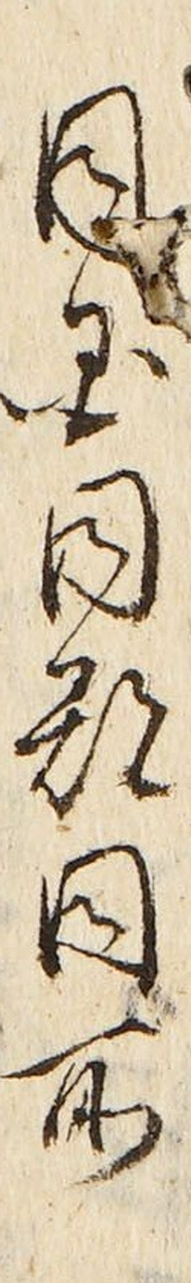同国同郡同所
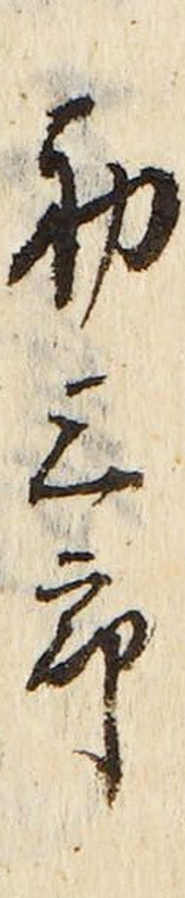初三郎
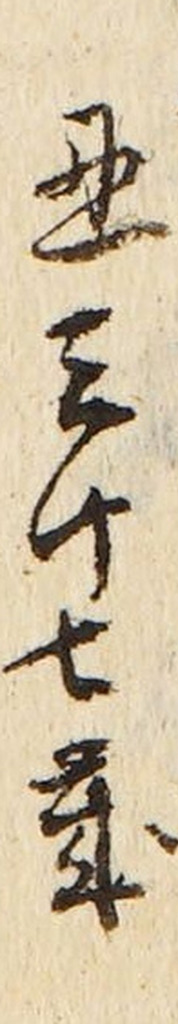丑三十七歳
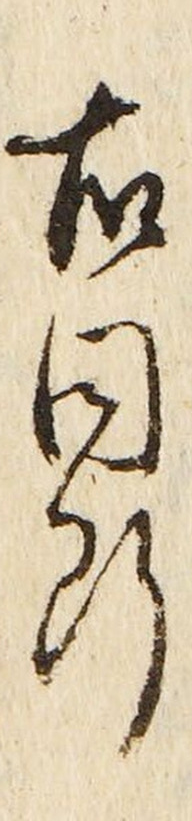右同断
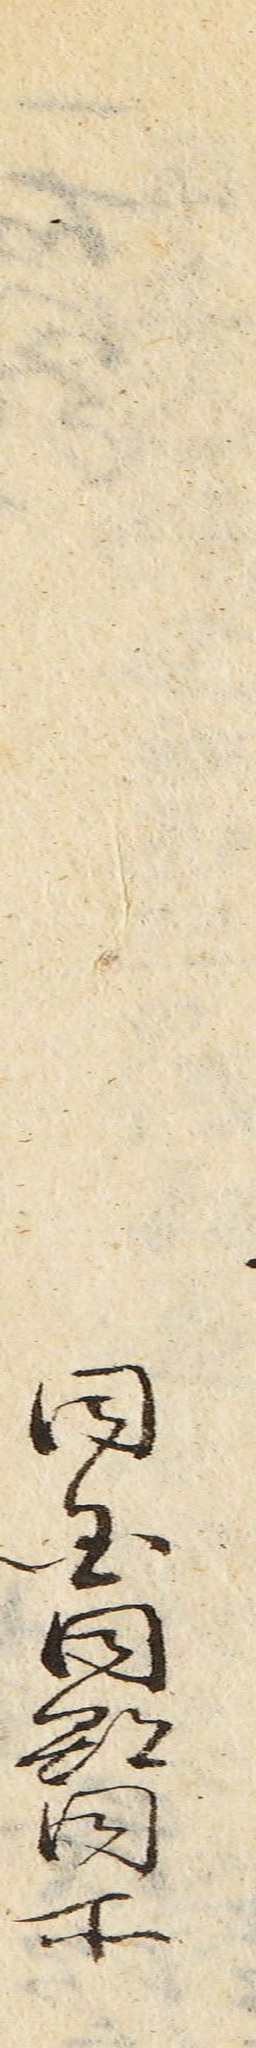同国同郡同所
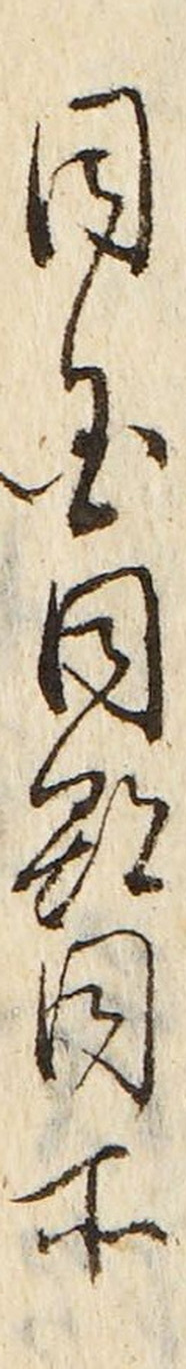同国同郡同所
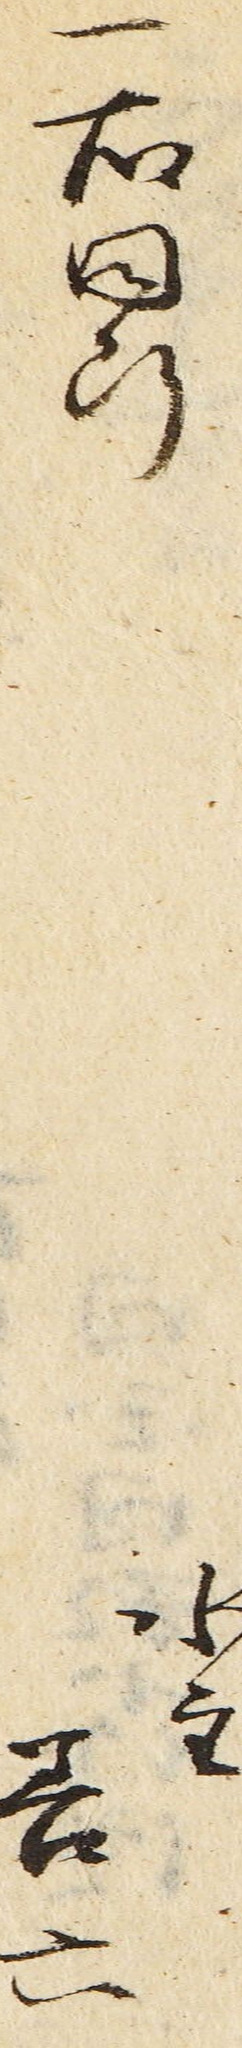一右同断水主
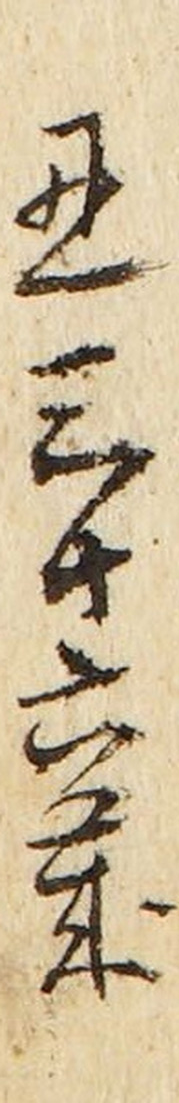丑三十六歳

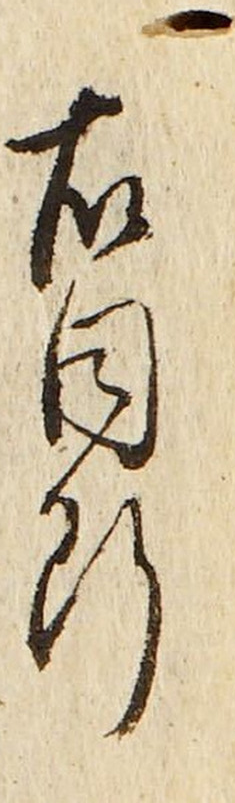右同断
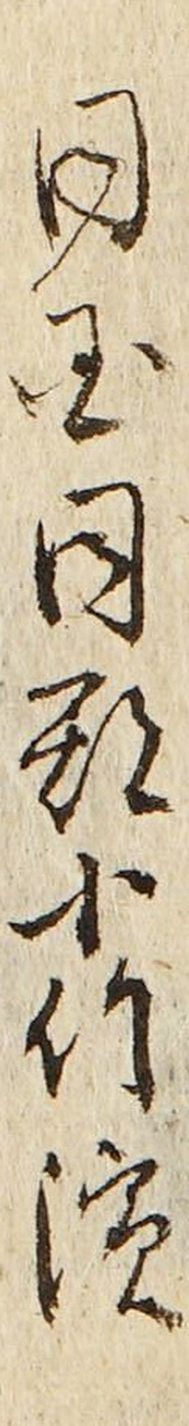同国同郡小竹浜
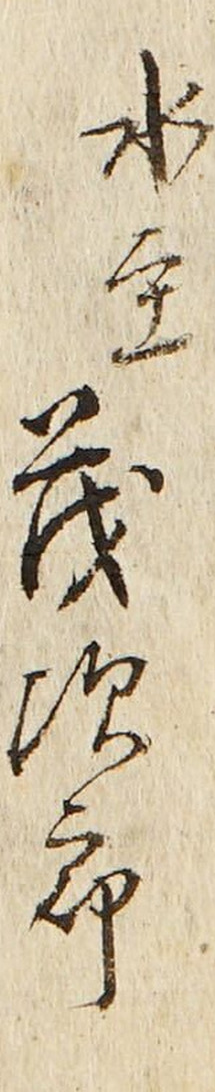茂次郎
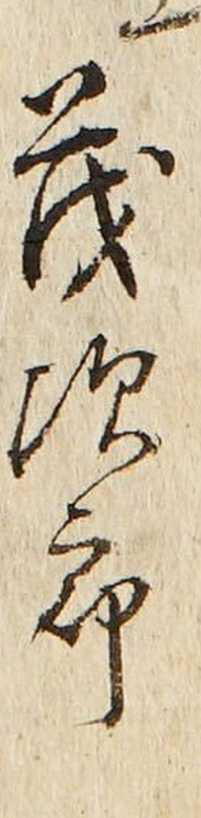茂次郎
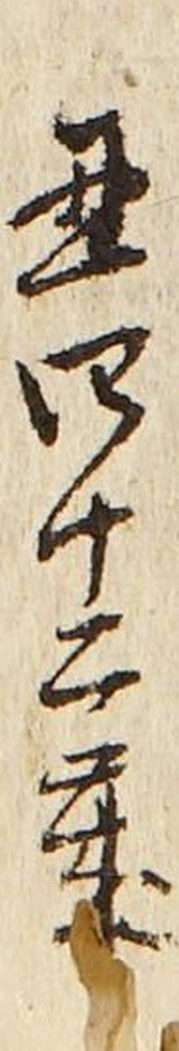丑四十二歳
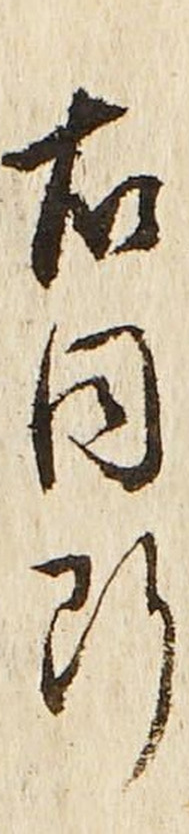右同断
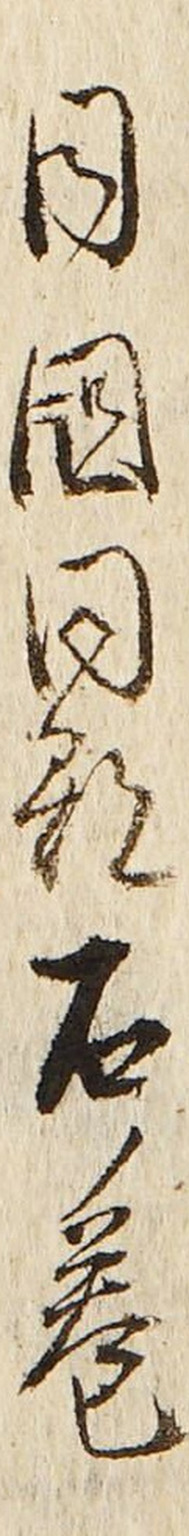同国同郡石ノ巻
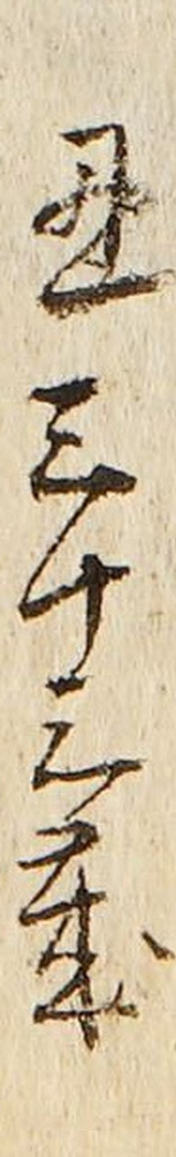丑三十三歳
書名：漂民後記
